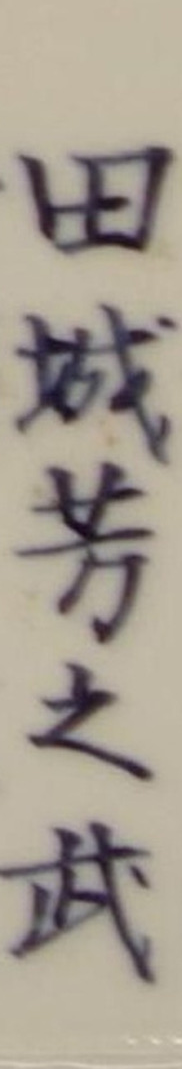田城芳之武
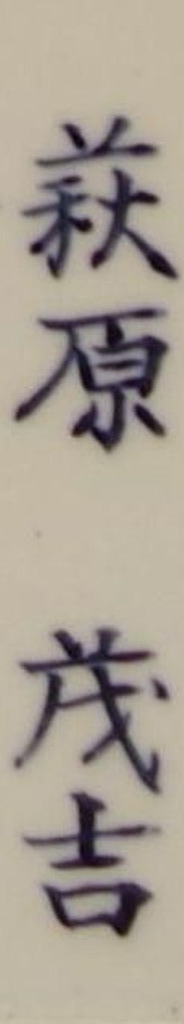萩原茂吉
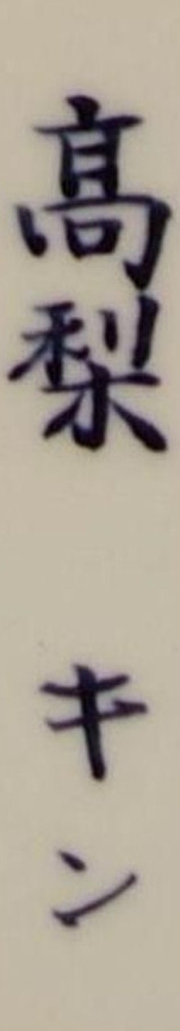高梨キン
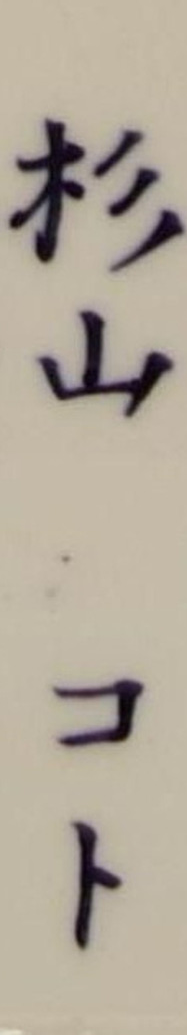杉山コト
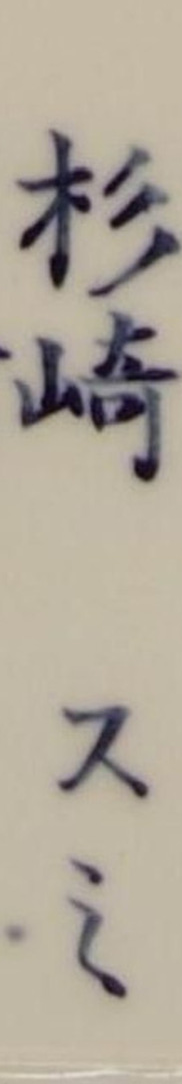杉崎スミ
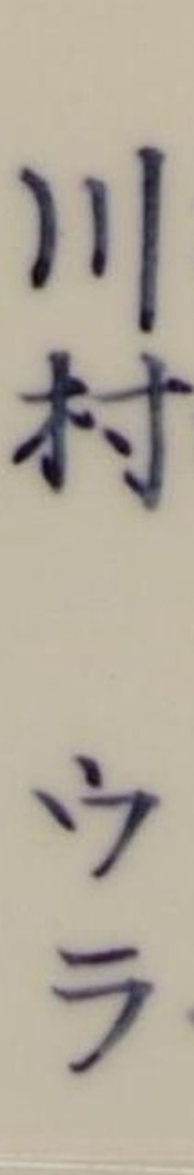川村ウラ
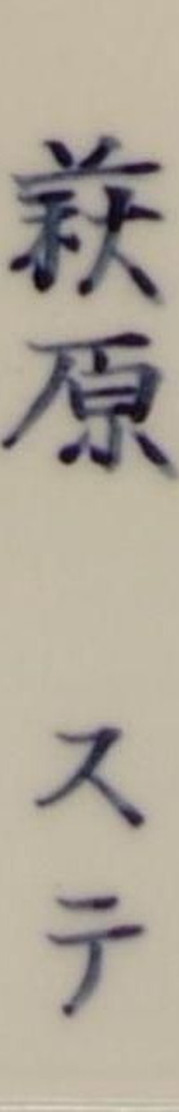萩原ステ
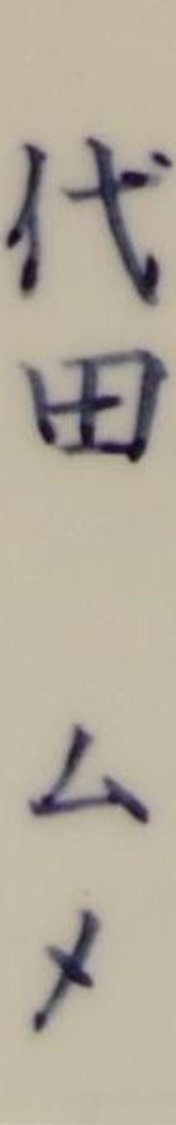代田ムメ
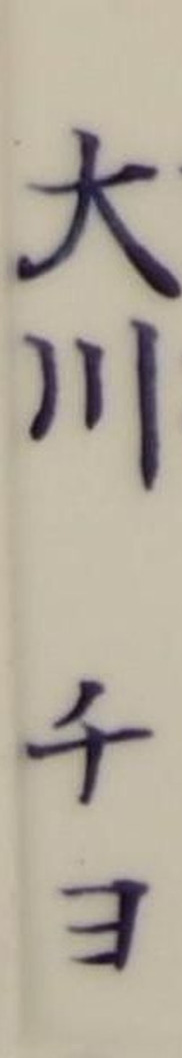大川チヨ

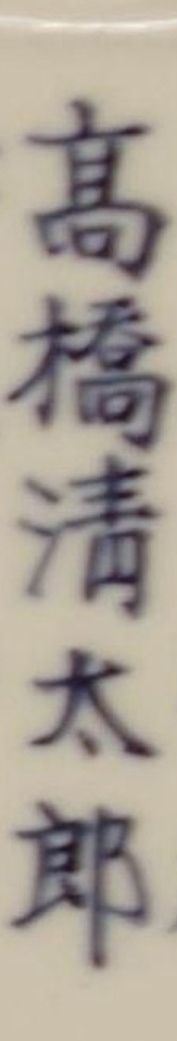高橋清太郎
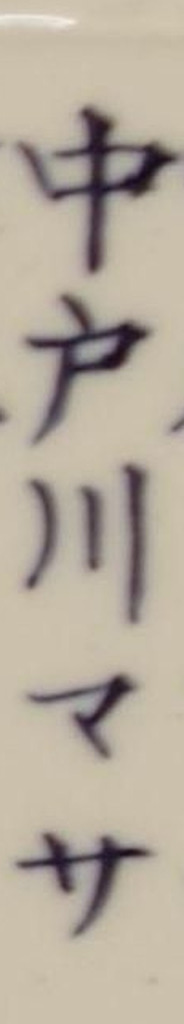中戸川マサ
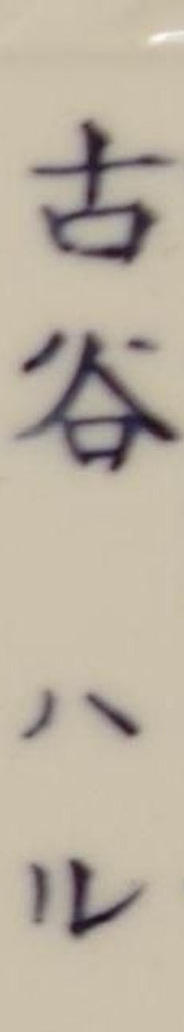古谷ハル
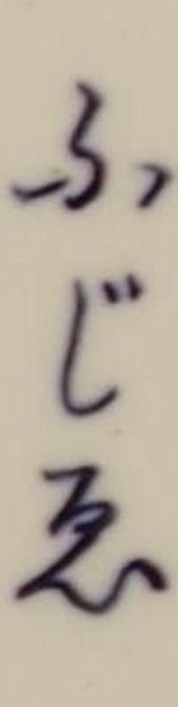ふじゑ
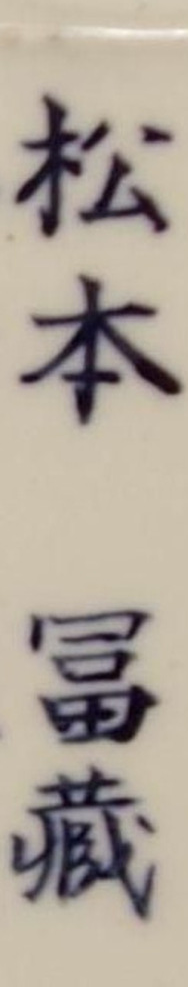松本冨蔵
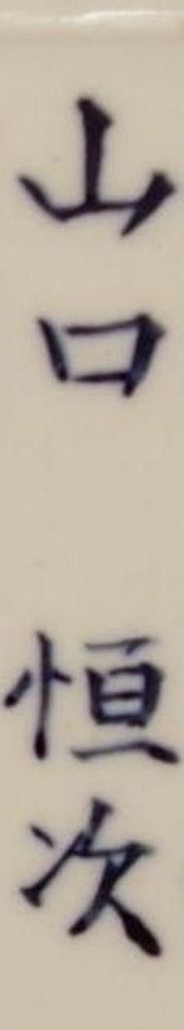山口恒次
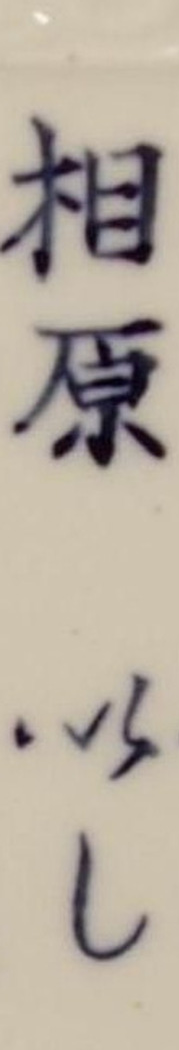相原いし
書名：M~S
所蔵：高野山金剛峯寺
